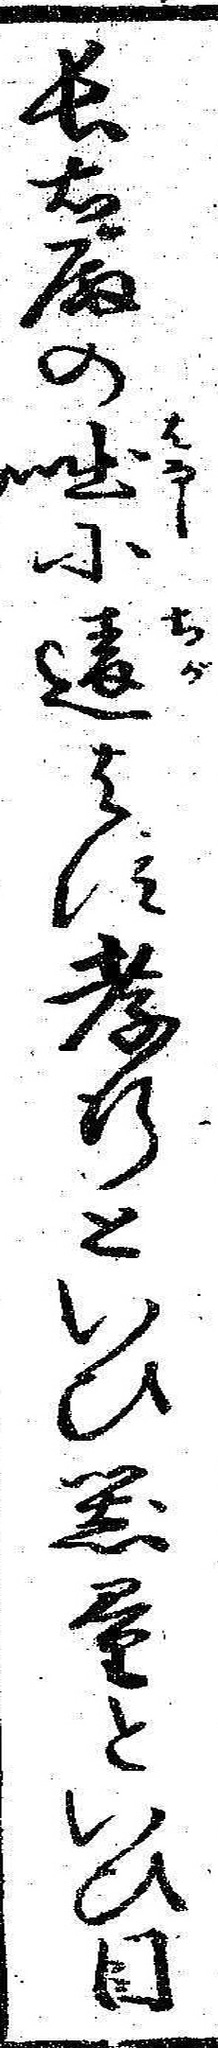長右殿の咄に違はす孝行といひ器量といひ目
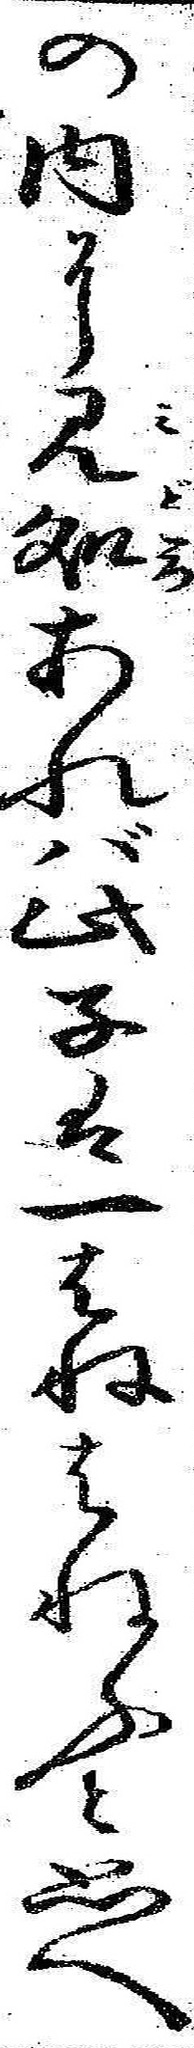の内に見処あれば此子は一はねはねふと思へ
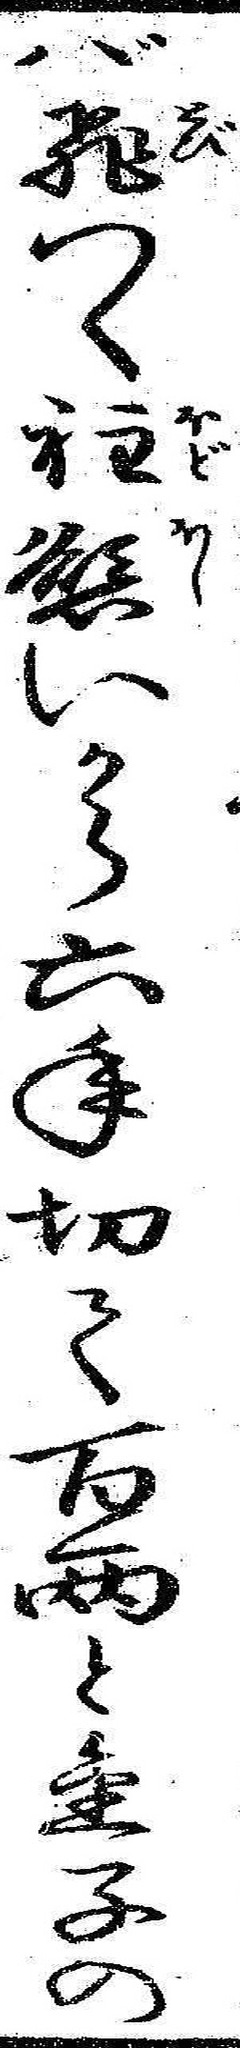ば飛つく程慾いから六年切て百両と金子の
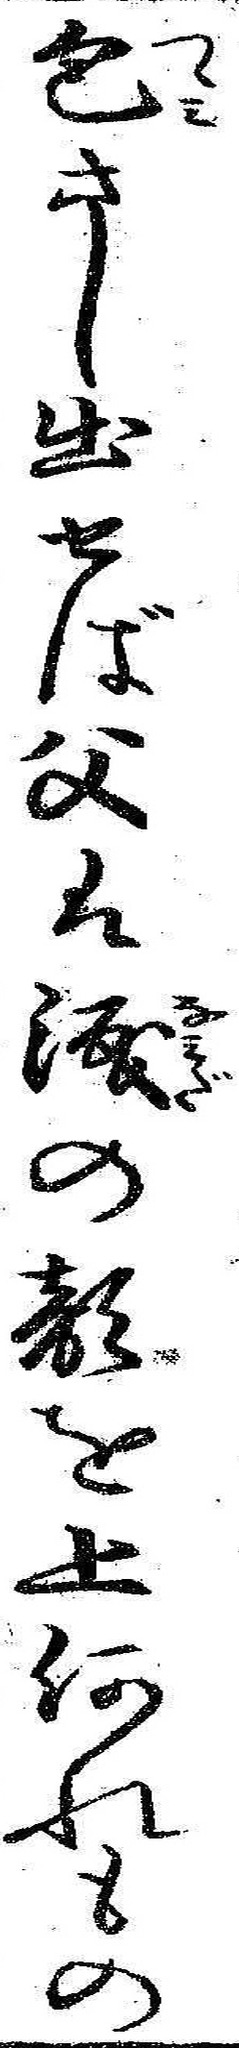包さし出せば父は涙の顔を上何れもの
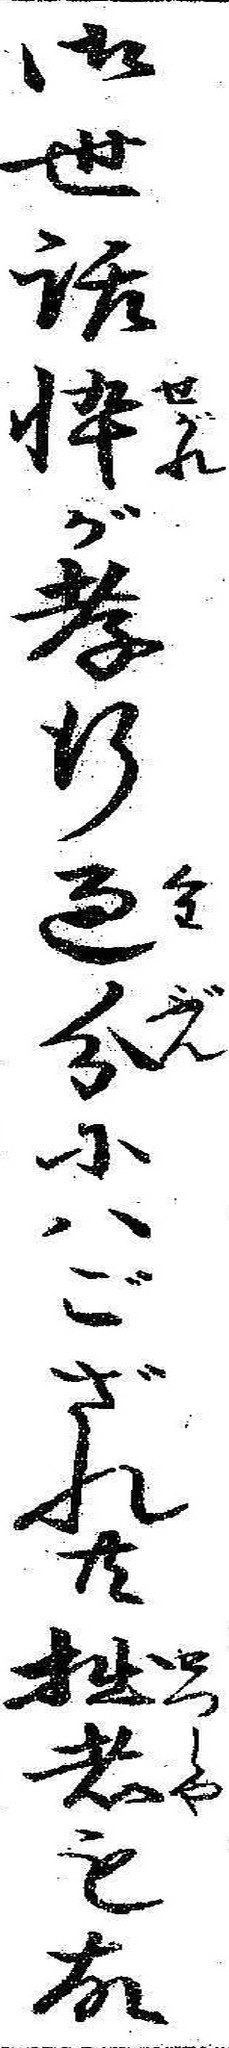御世話忰が孝行過分にはござれ共拙者も故
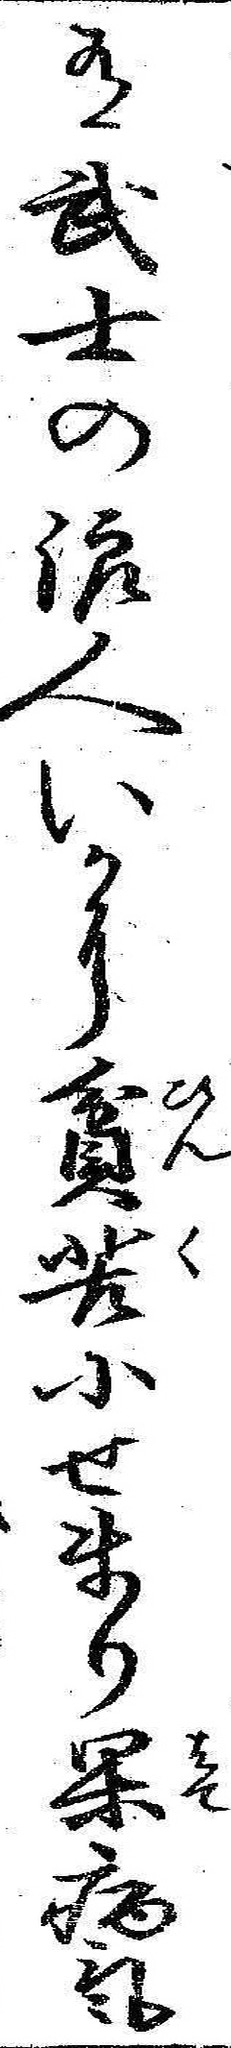有る武士の浪人いかに貧苦にせまり果病気
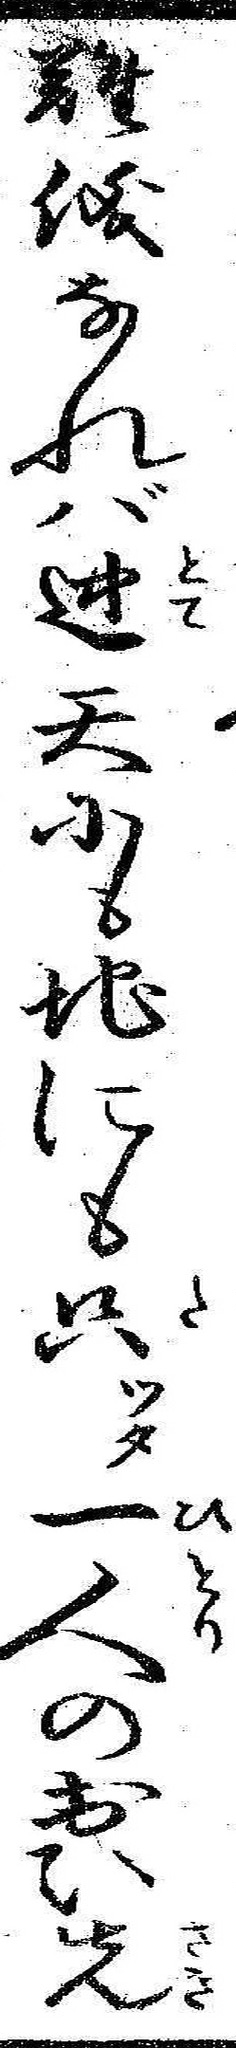難儀なれば迚天にも地にも只一人のおひ先
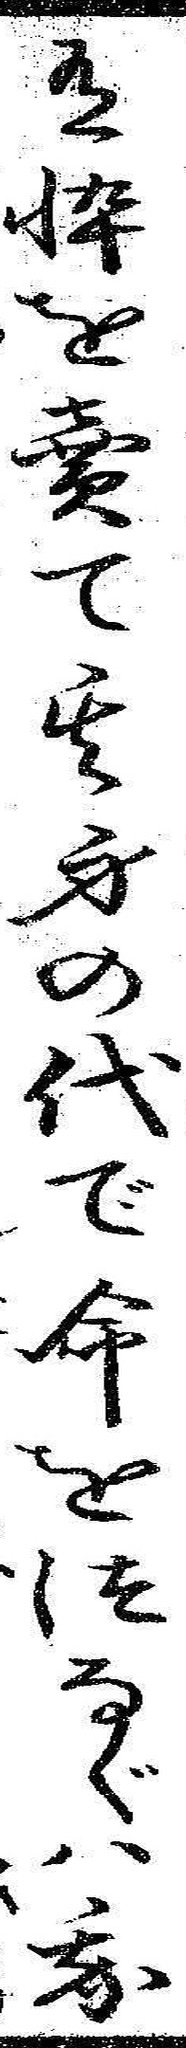有忰を売て其身の代で命をつなぐは我
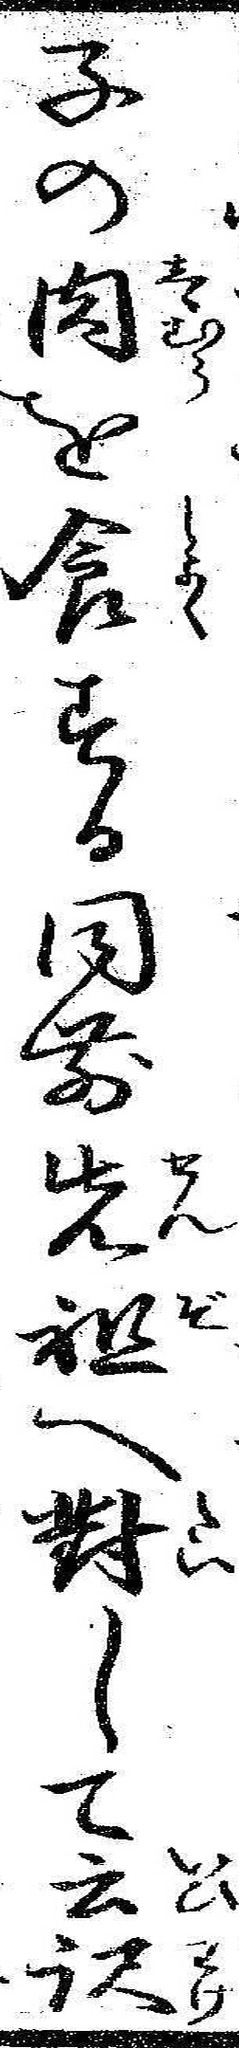子の肉を食する同前先祖へ対して云訳
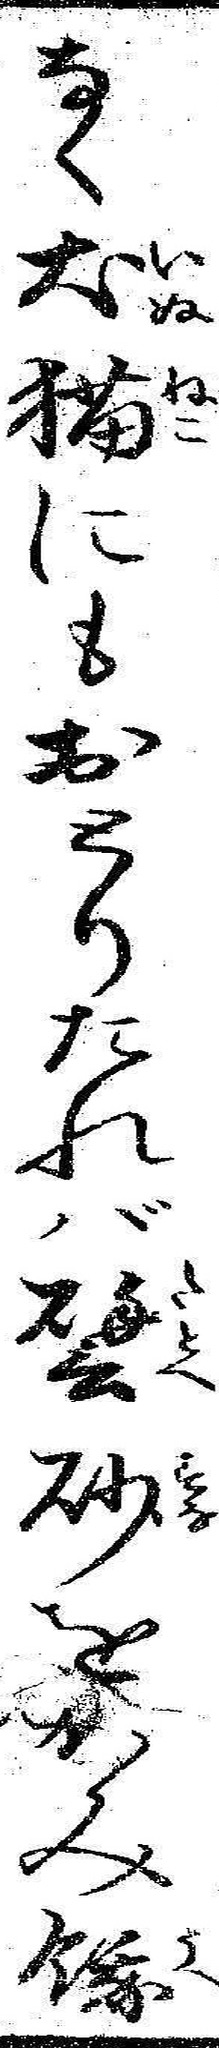なく犬猫にもおとりたれば譬砂をかみ餓
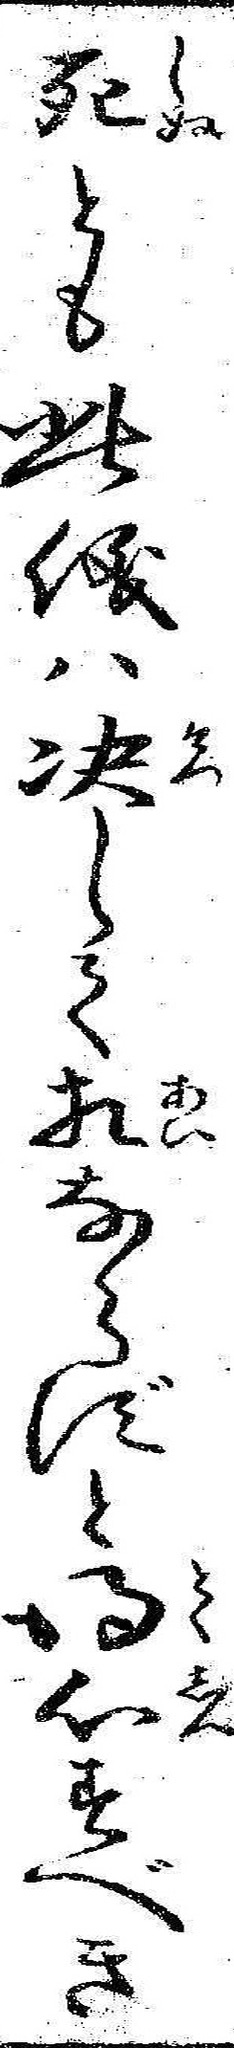死ともは決して相ならずと得心すべき

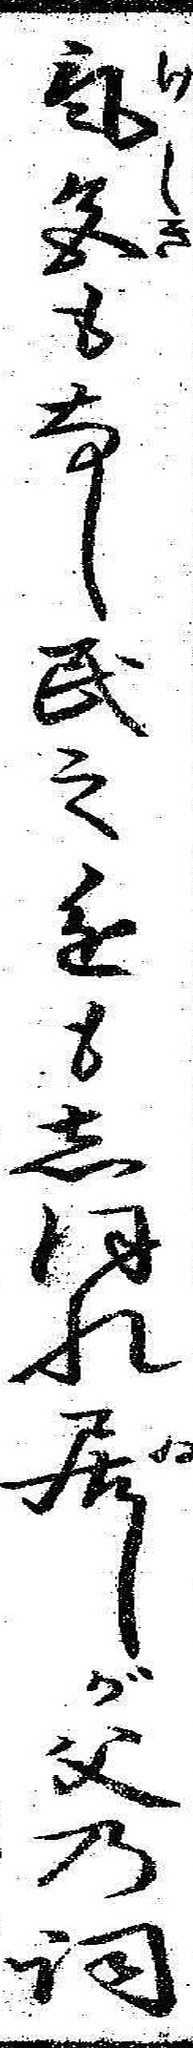気色もなし民之進もしほれ居しが父の詞
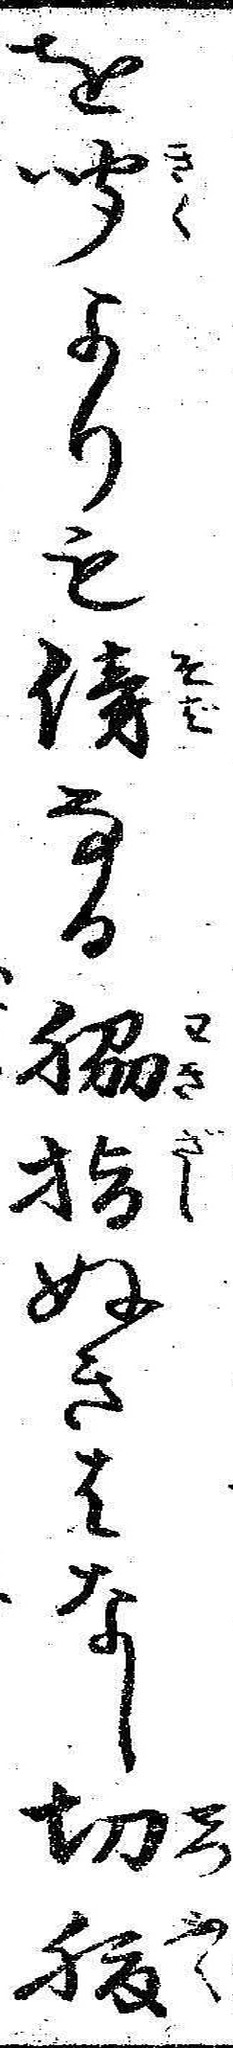を聞よりも傍なる脇指ぬきはなし切腹
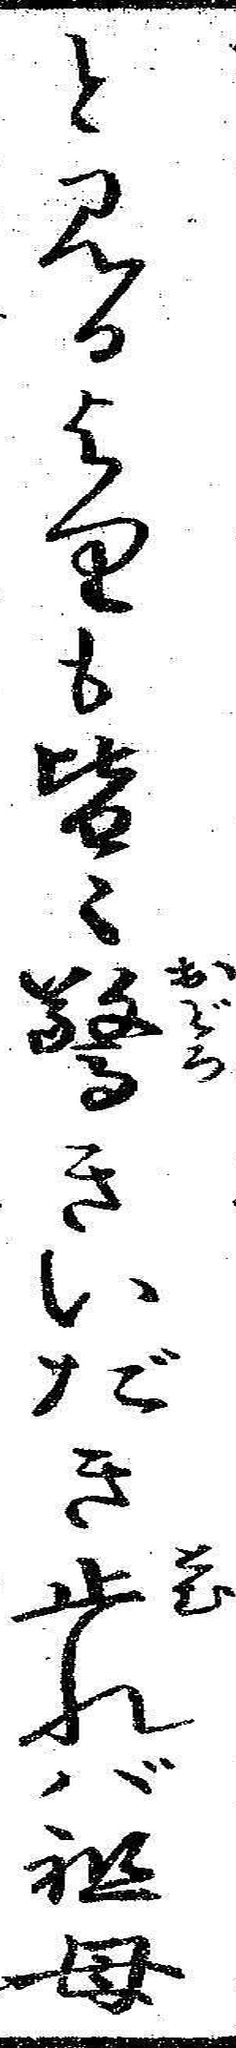と見るよりも皆々驚きいだき止れば祖母
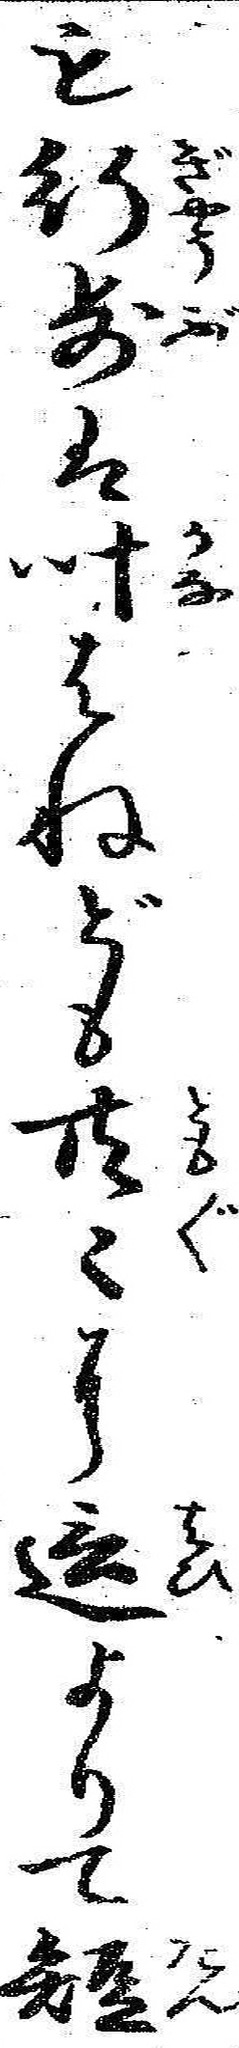も行歩は叶はねども共々に這よりて短
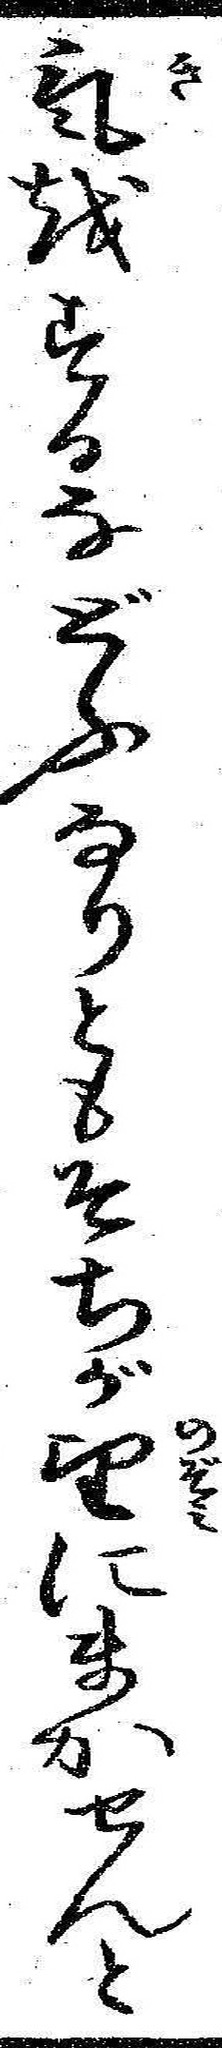気をするなどふなりともそちが望にまかせんと
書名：根無草後編
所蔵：国文学研究資料館
